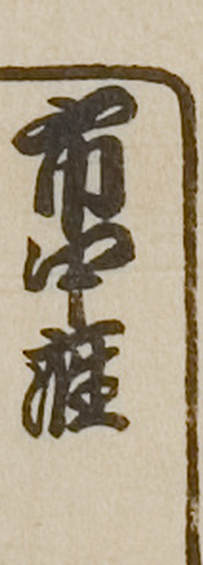市中座
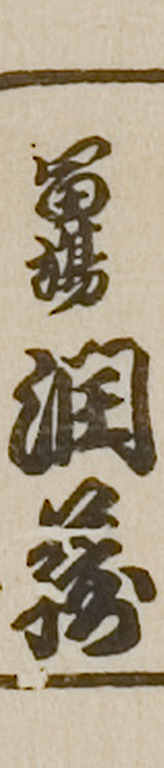富場潤蔵
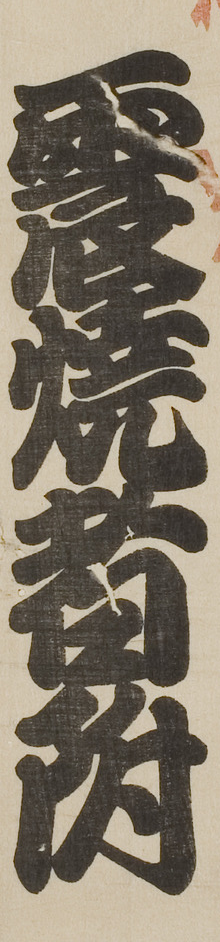震焼者附
